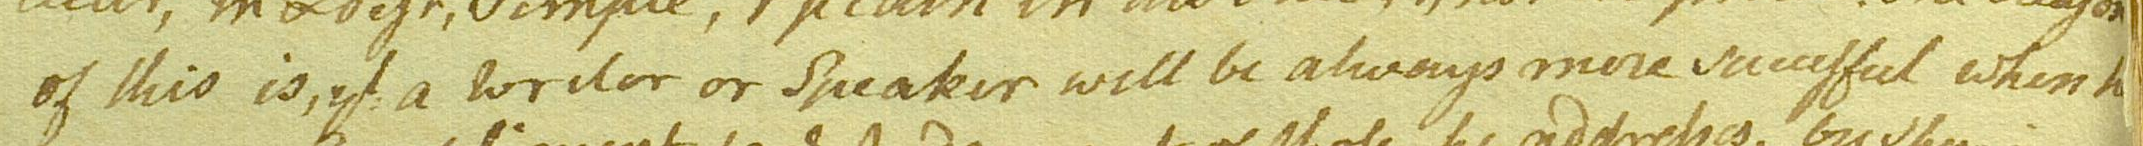of this is, y^t: a writer or Speaker will be always more successful when he
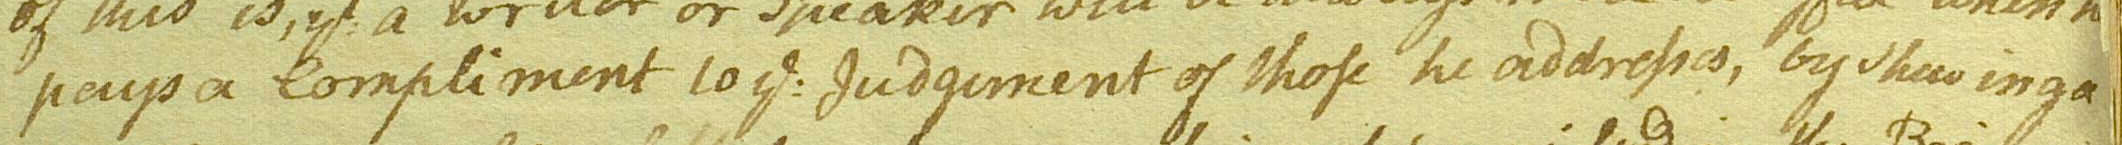pays a Compliment to y^e: Judgement of those he addresses, by shewing a
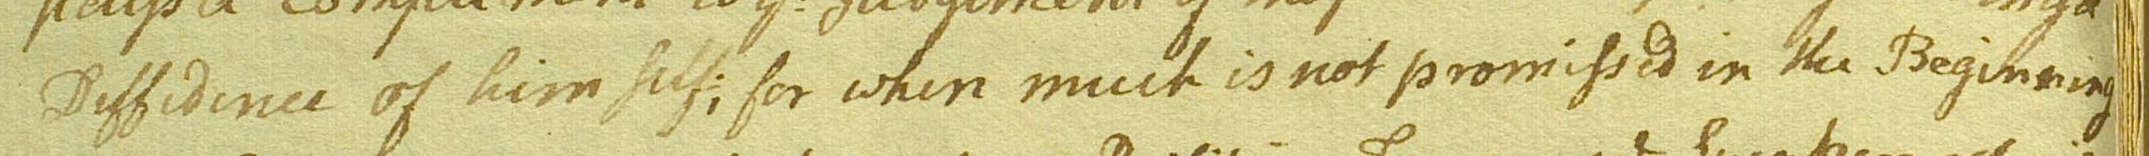Diffidence of himself; for when much is not promised in the Beginning
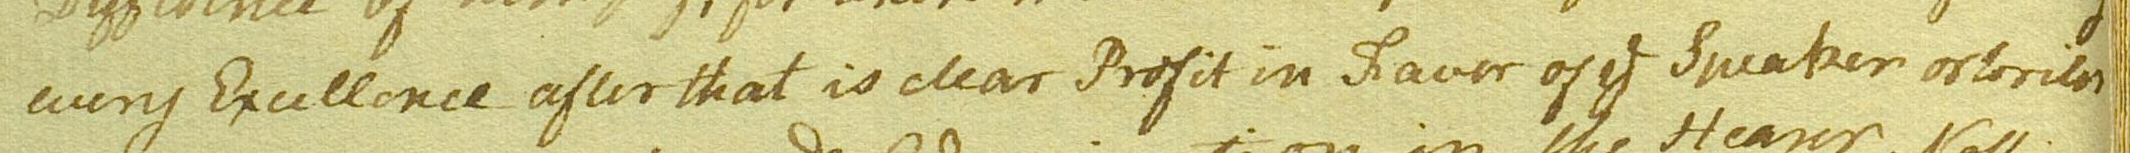every Excellence after that is clear Profit in Favor of y^e Speaker or Writer
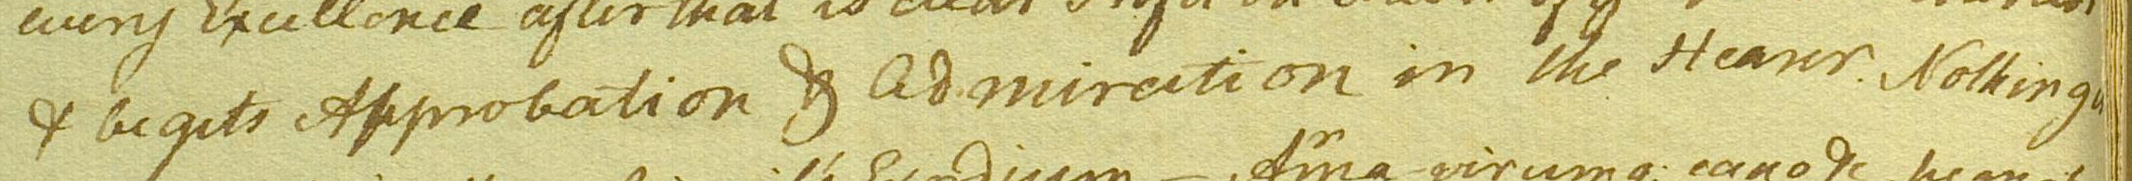& begets Approbation & Admiration in the Hearer. Nothing
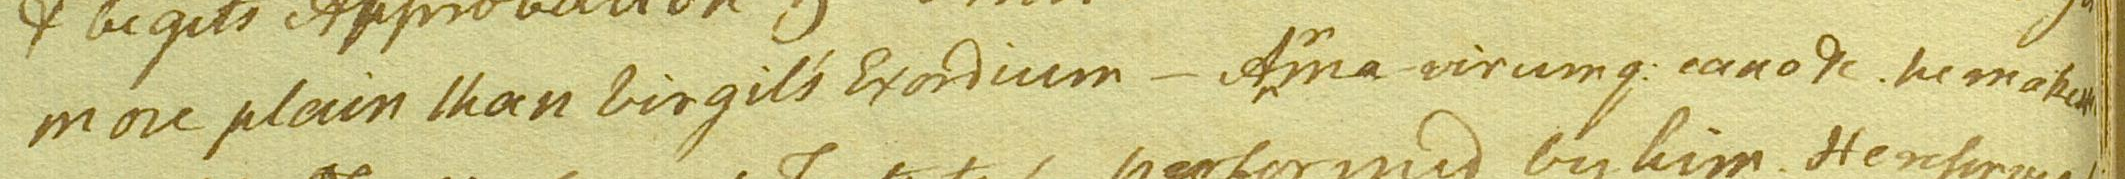move plain than Virgil's Exordium- A^rma virumq: cano &c he makes
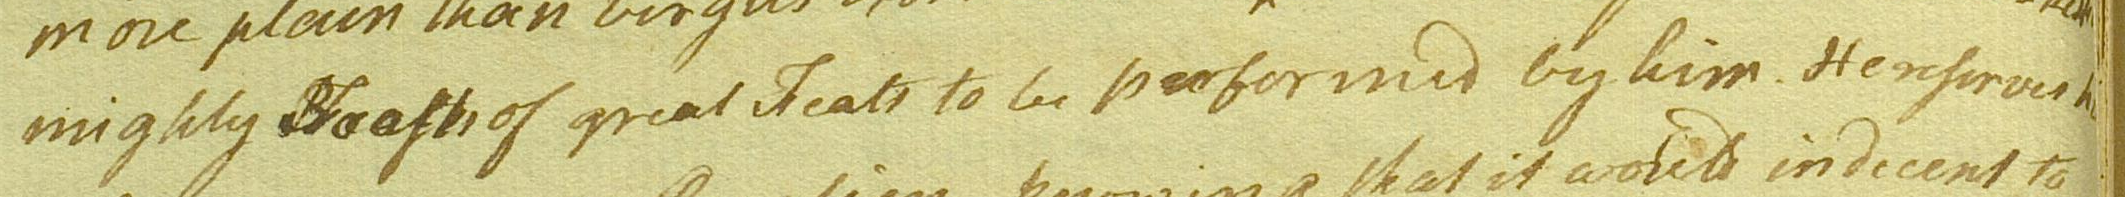mighty Boasts of great Feats to be performed by him. He reserves his
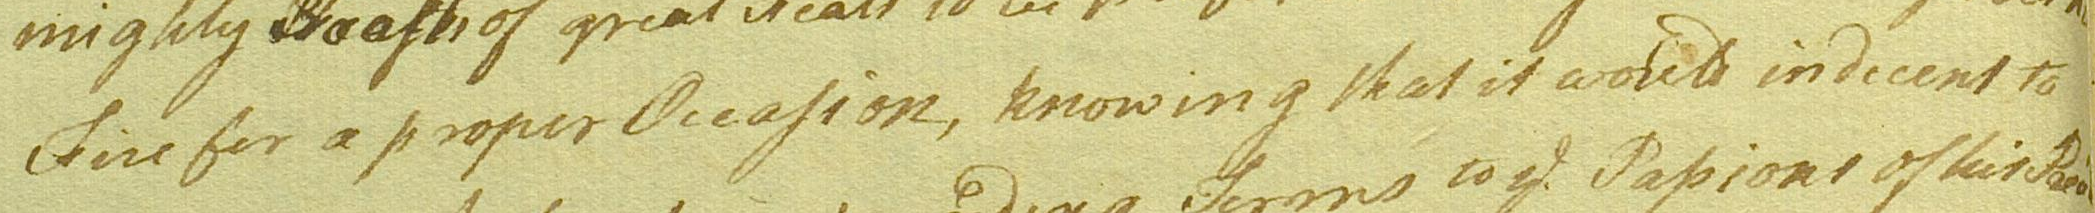Fire for a proper Occasion, knowing that it would indecent to
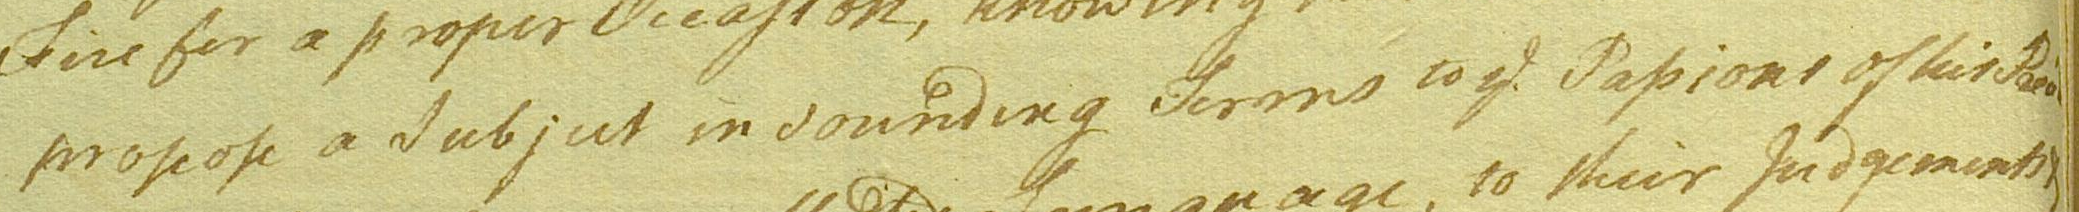propose a Subject in sounding Terms to y^e Passions of his P[___]
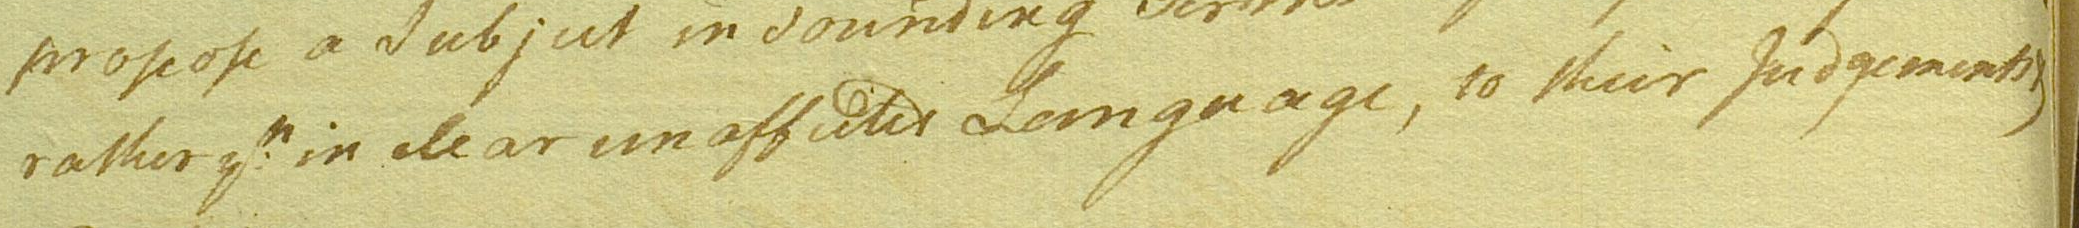rather y^n: in clear unaffected Language, to their Judgement &
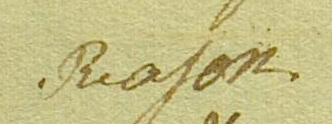Reason.
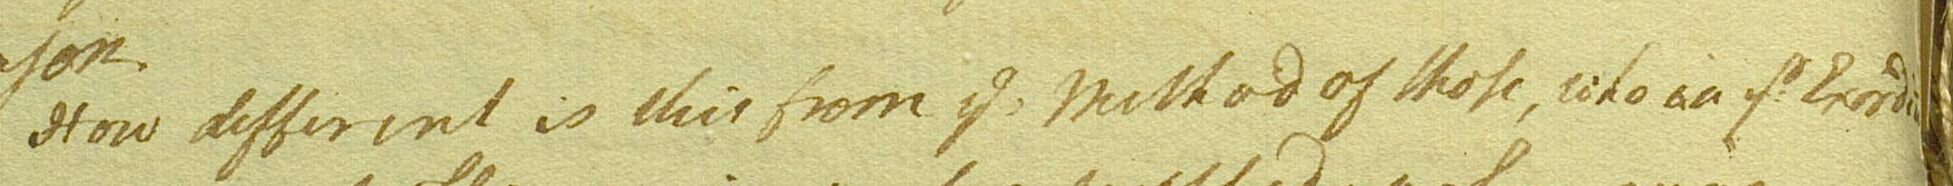How different is this from y^e Method of those, who in y^e Exordi
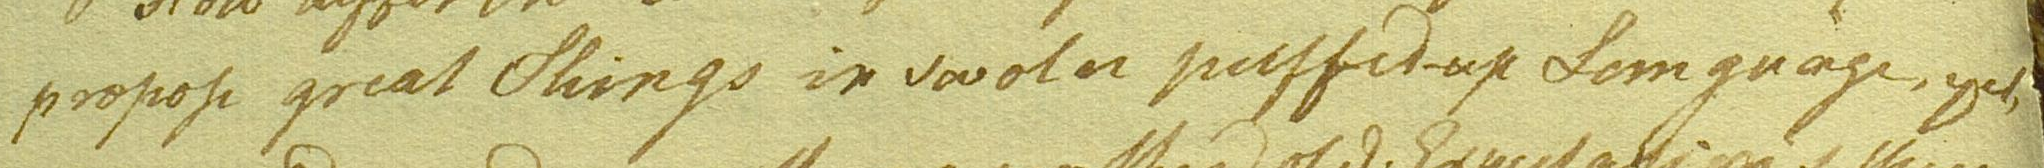propose great Things in swolen puffed-up Language, yet
